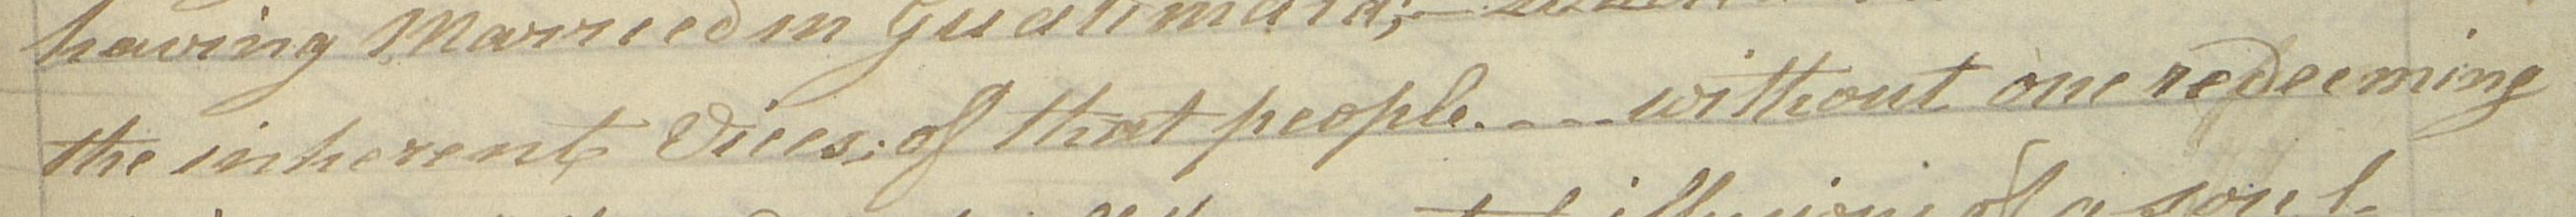the inherent Vices; of that people. without one redeeming
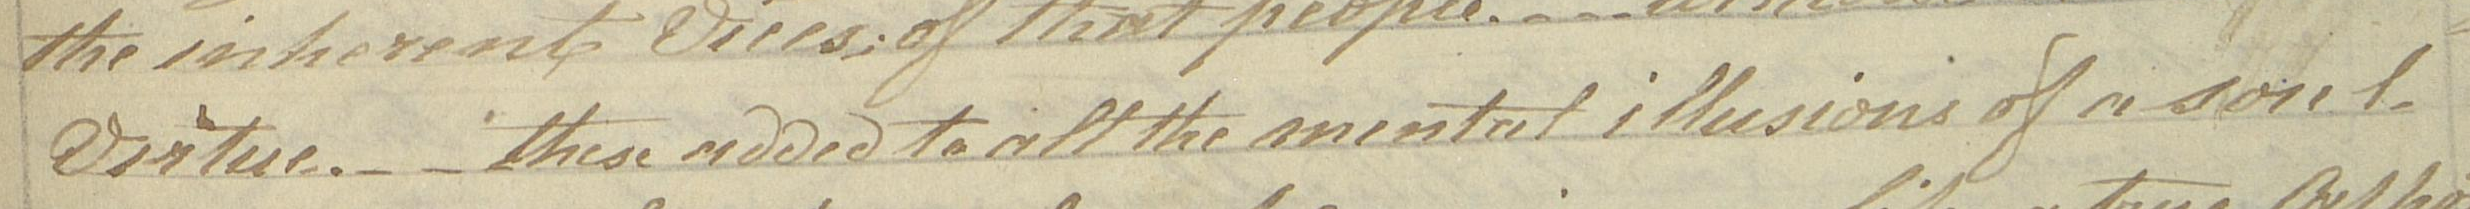Virtue. these added to all the mental illusions of a soul
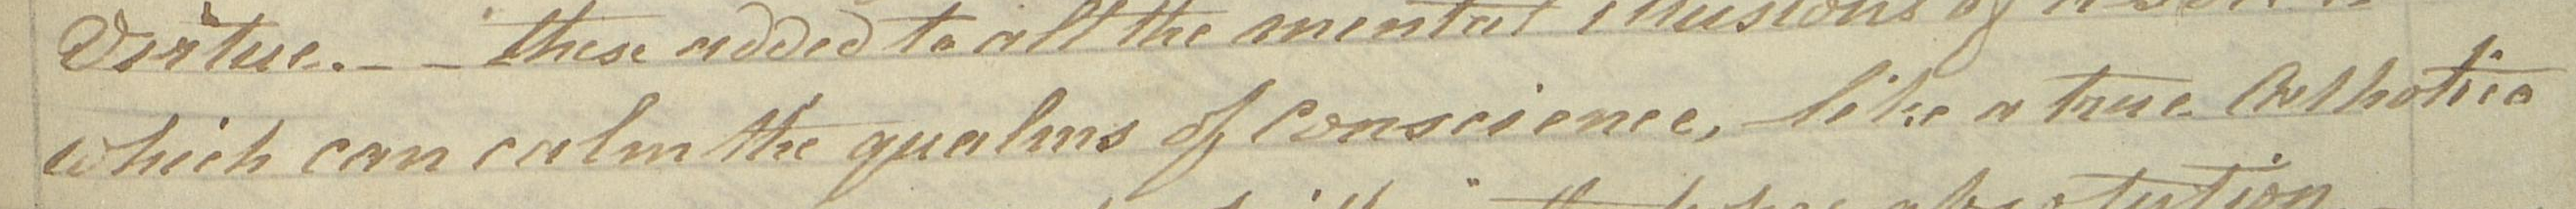which can calm the qualms of conscience, like a true Aspotico
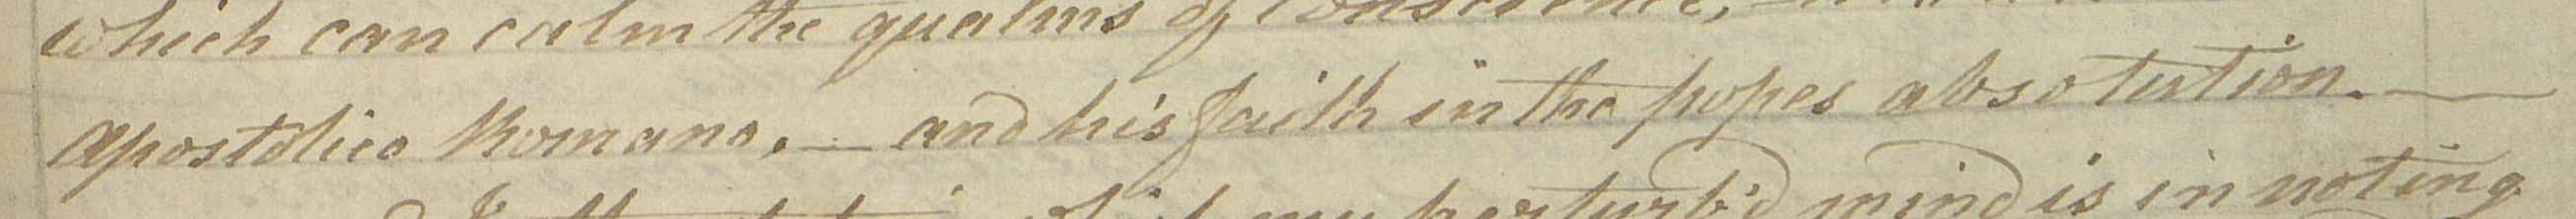Apostolico Romano,- and his faith in the popes absolution.
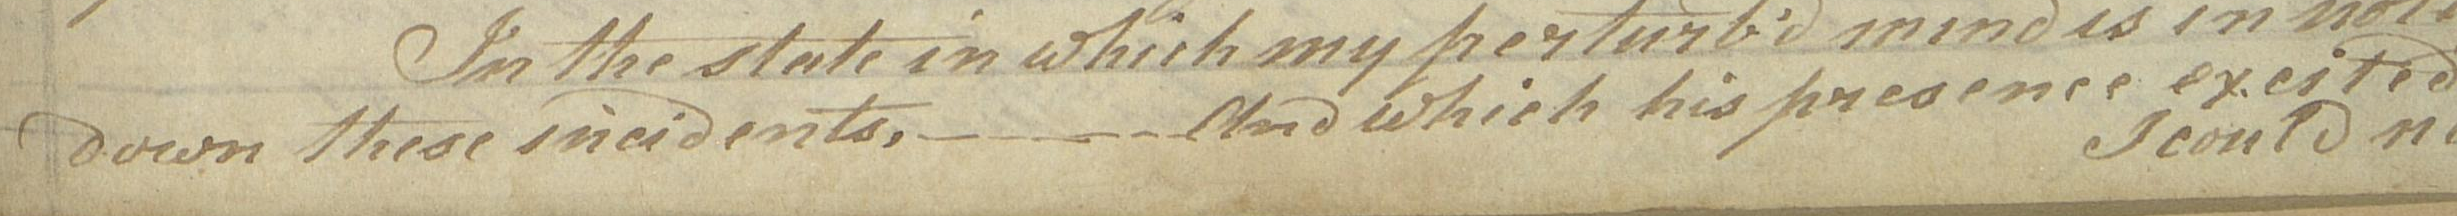down these incidents. And which his presence excited
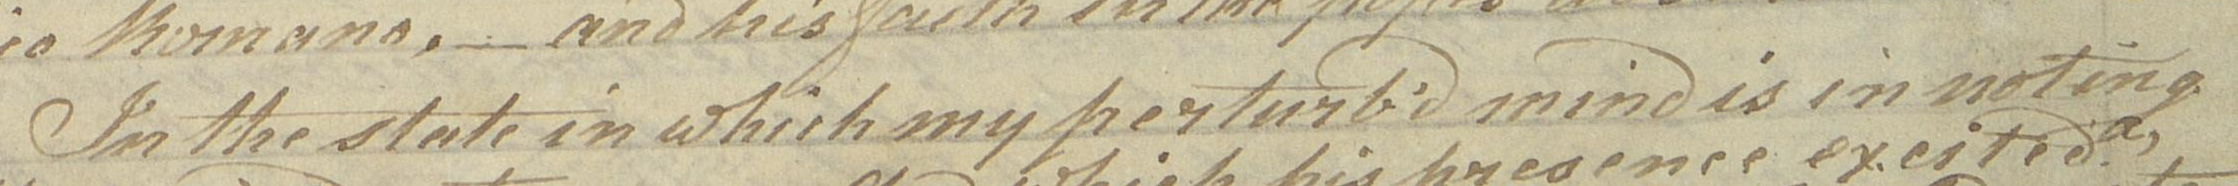In the state in which my perturb'd mind is in noting
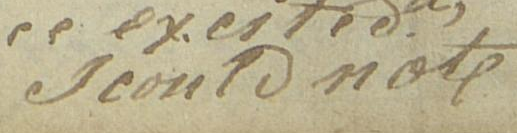I could not
